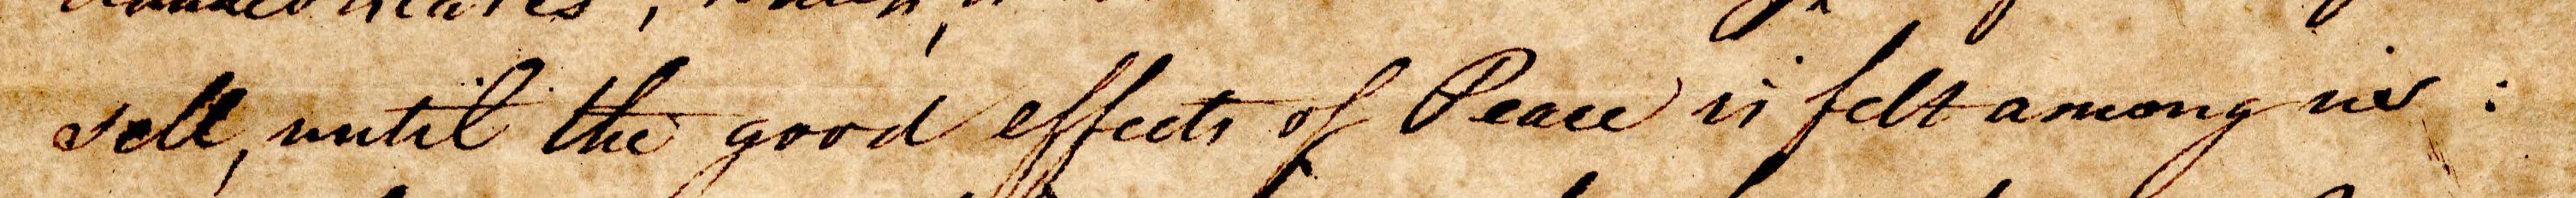sell, until the good effects of Peace is felt among us:
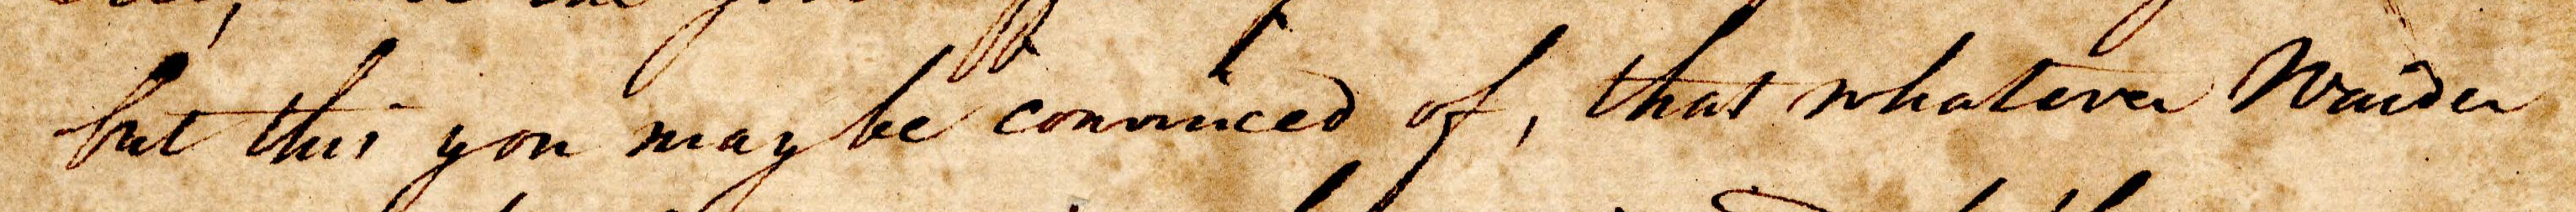but this you may be convinced of, that whatever Warder
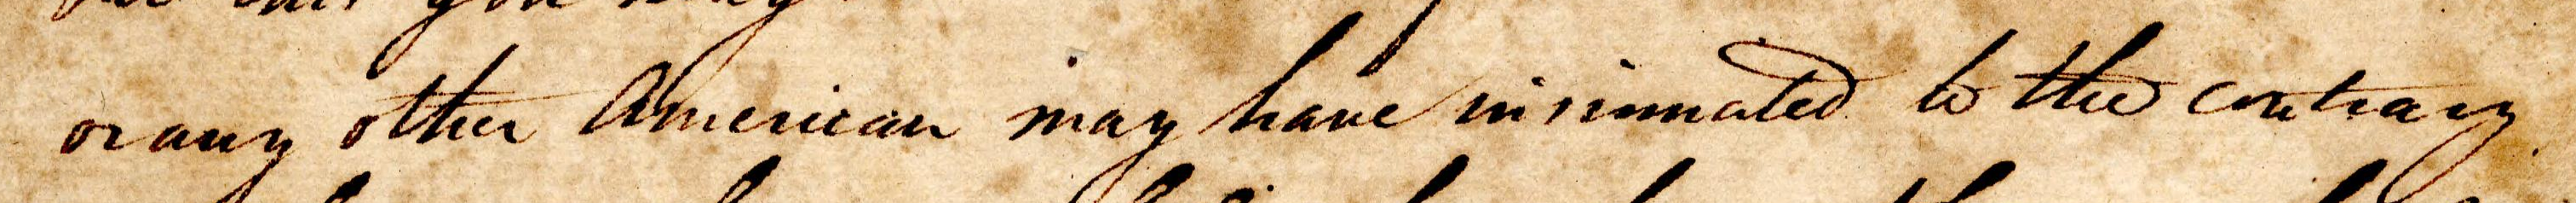or any other American may have insinuated to the contrary
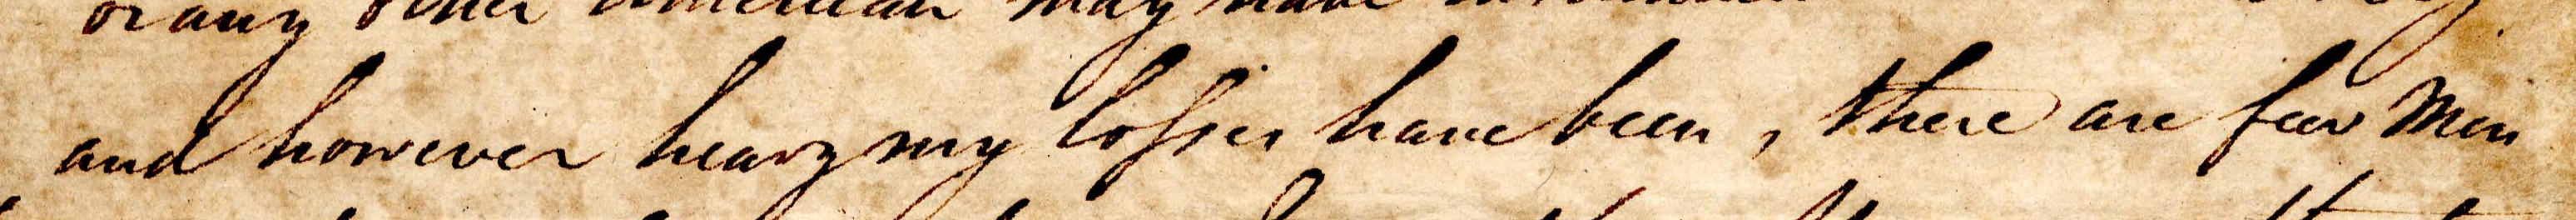and however heavy my losses have been, there are few Men
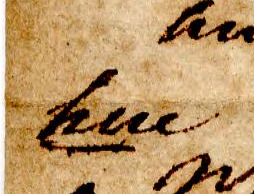here
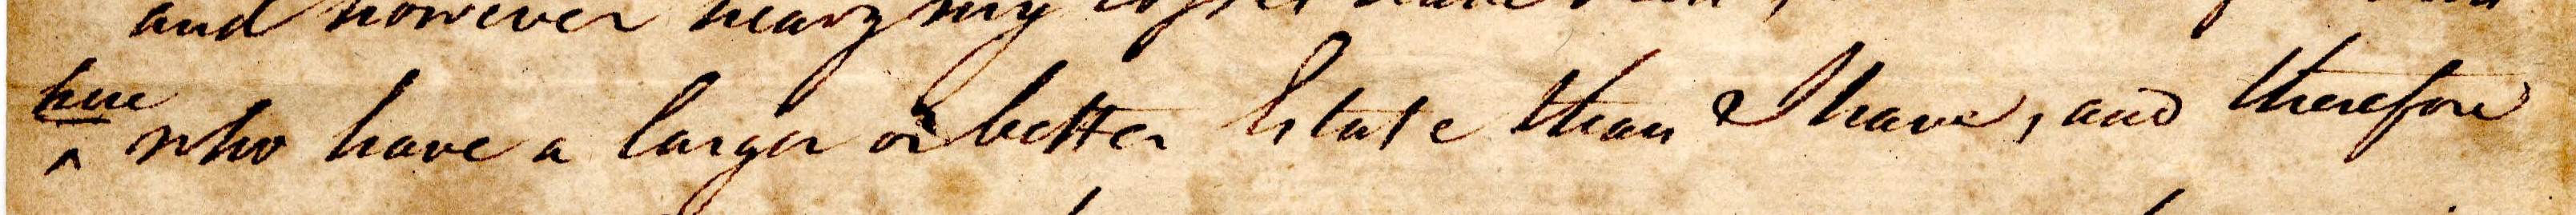^ who have a larger or better Estate than I have, and therefore
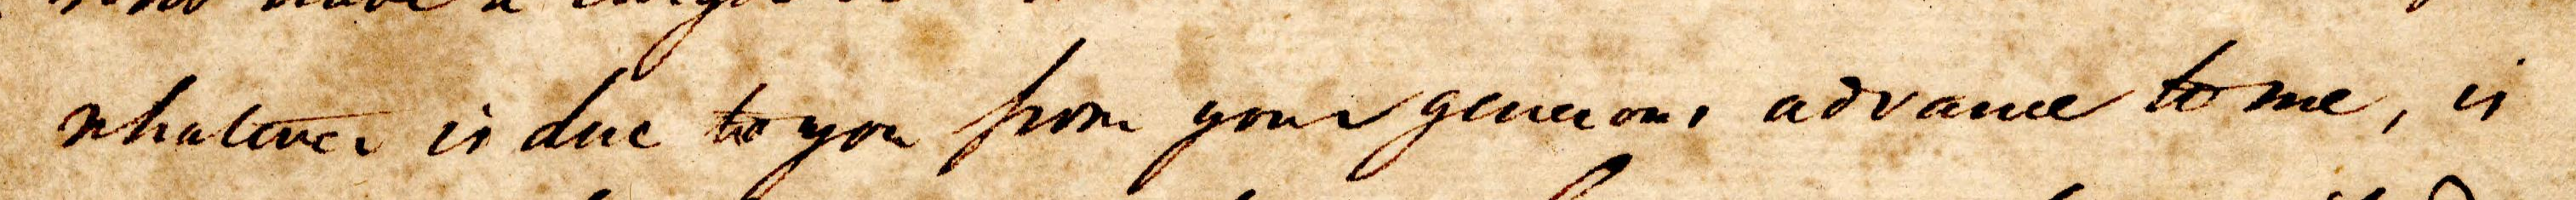whatever is due to you from your generous advance to me, is
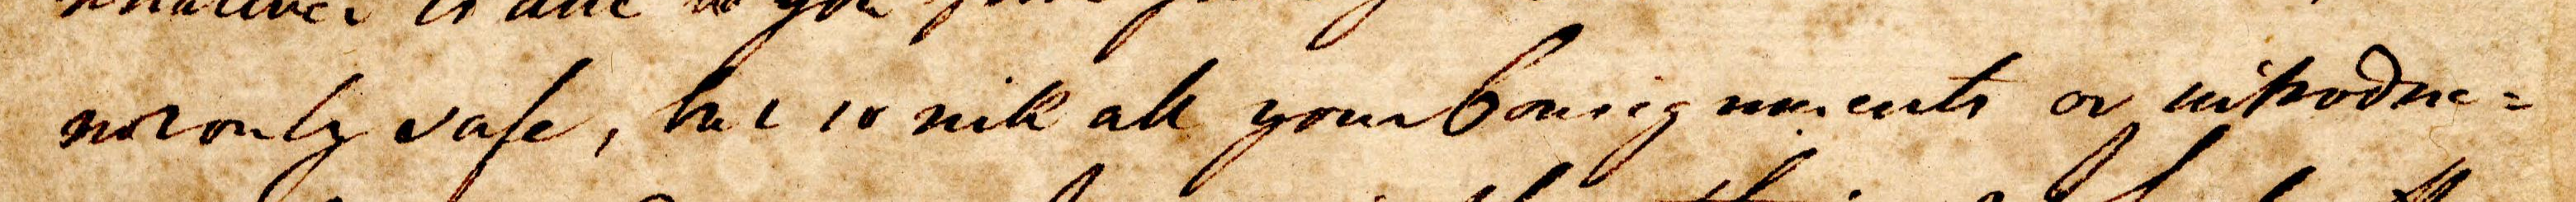not only safe, here to with all your Cousin meets or impoduc-
